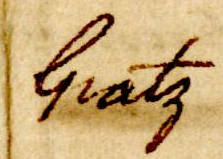Gratz
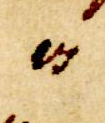25
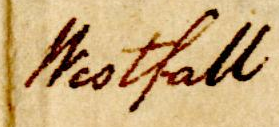Westfall
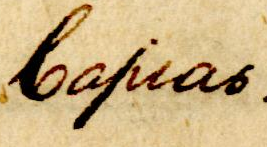Capias
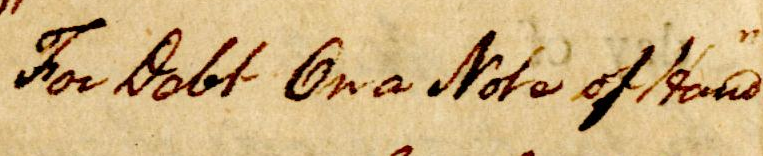For Debt. On a Note of Hand
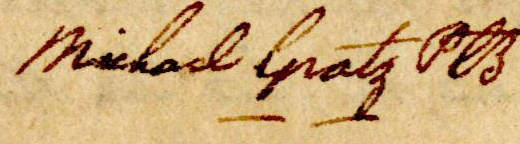Michael Gratz P03
